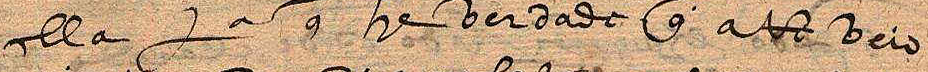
ella ta q̄ he verdade q̄ a Re veio
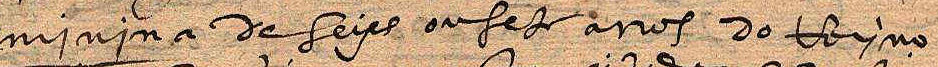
mjnjna de seys ou sete anos do Reyno
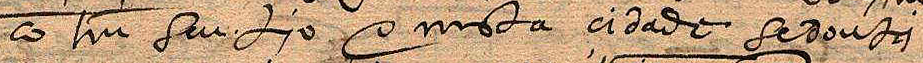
c̄o hū seu tjo e nesta çidade se doutrj
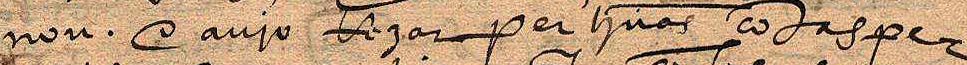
nou . e a ujo Rezar per hūas c̄otas per
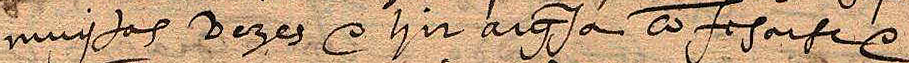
muytas vezes e hir a iḡJa c̄ofesarse e
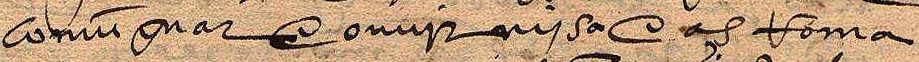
comūgar e ouujr mjsa e as Roma
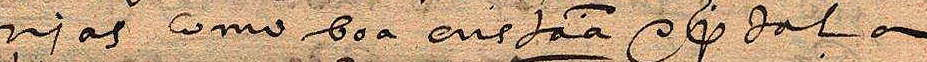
ryas como boa cristaā e p̄o tal a
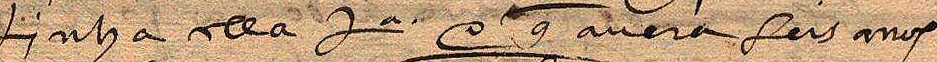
tjnha ella ta . e q̄ auera seis anos
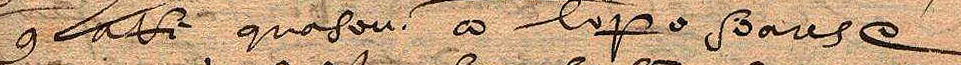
q̄ a Re quasou c̄o lopo soares e
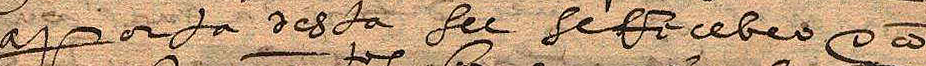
a porta desta see se Reçebeo e c̄o
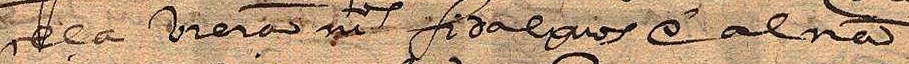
ella vierão mtos fidalguos e al não
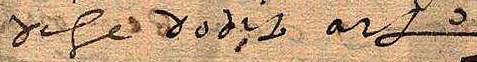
dise do dito arto
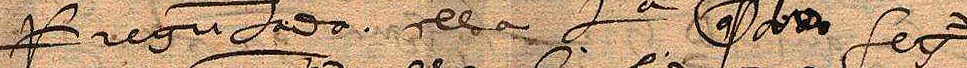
Pregūtada . ella ta p̄lo sego
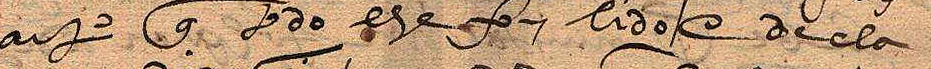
arto q̄ todo lhe foy lido e decla
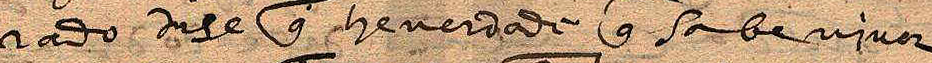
rado dise q̄ he uerdade q̄ sabe ujuer
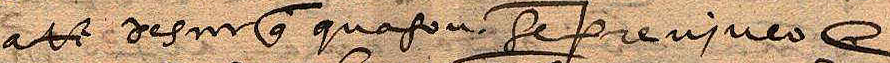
a Re desne q̄ quasou s̄epre ujueo ē
